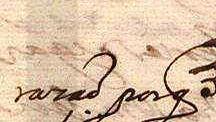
razaõ por q̄
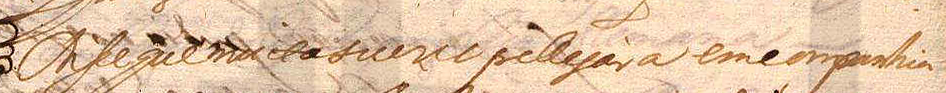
Disse que muitas uezes pellejara em companhia
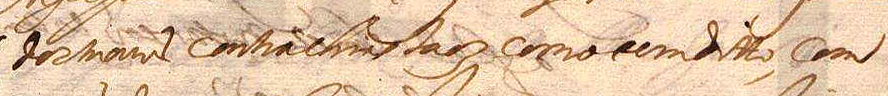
dos mouros contra christaõs como tem ditto, com
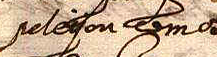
pelejou com os
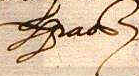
xpaõs
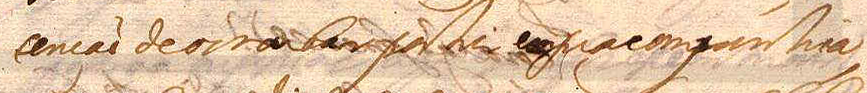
tençaõ de os roubar por hir em sua companhia
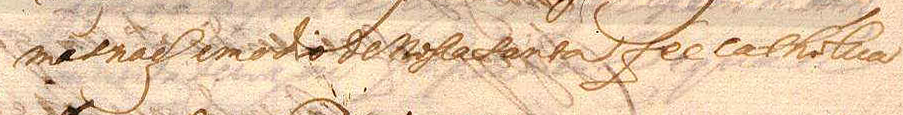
mas naõ em odio de nossa santa fee catholica
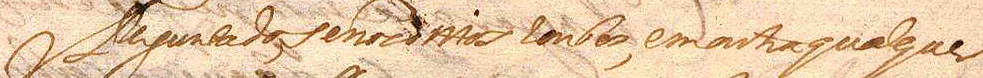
item Perguntado, se nos dittos roubos, em outra qualquer
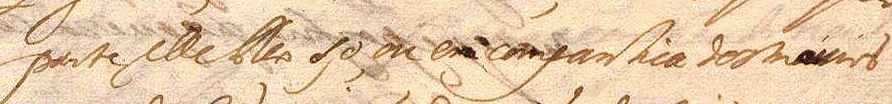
parte elle Reo so, ou em companhia dos mouros
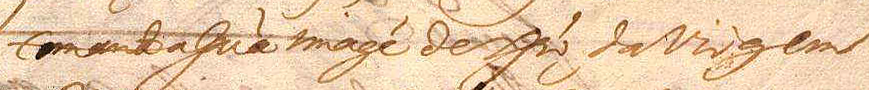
tomando alguā imagē de xpō, da virgem
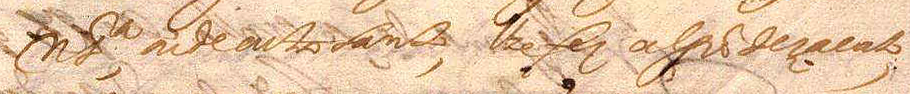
n sr.a ou de outro santo, lhe fez algū dezacato,
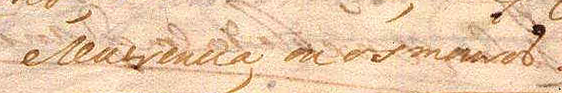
ereuerencia, ou os mouros
